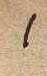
1
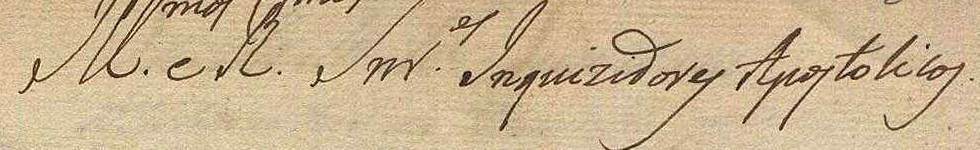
Ill.mos e R.mos Snr.es Inquizidores Apostolicos.
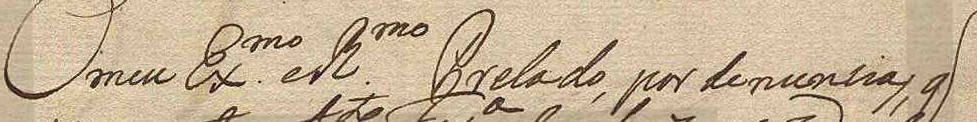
O meu Ex.mo e R.mo Prelado, por denuncias, q̄
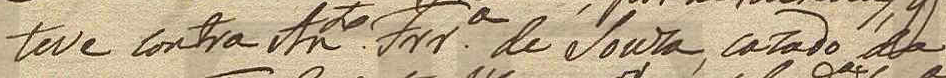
teve contra An.to Frr.a de Souza, cazado da
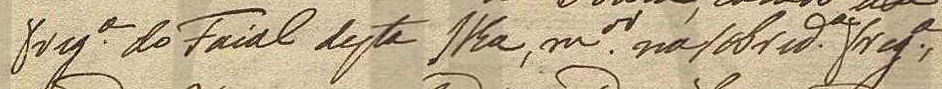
freg.a do Faial desta Ilha, m.or na sobred.a freg.a,
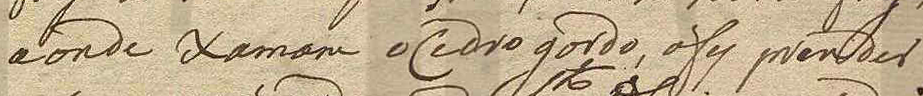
aonde xamam o Cedro gordo, o fes prender
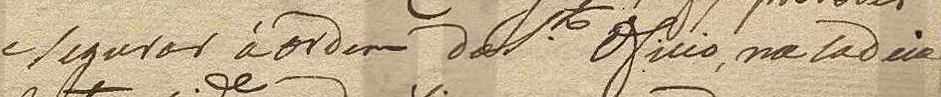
e segurar á ordem do S.to Oficio, na cadeia
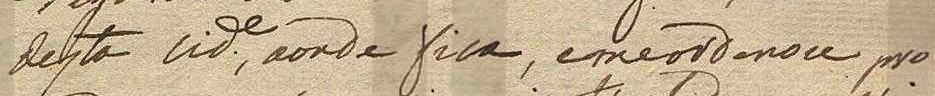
desta cid.e, aonde fica, e me ordenou pro
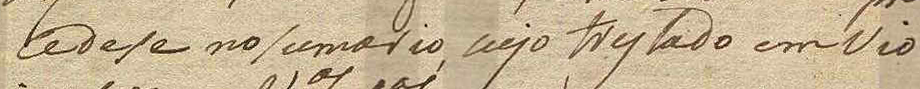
Cedese no sumario, cujo treslado emvio
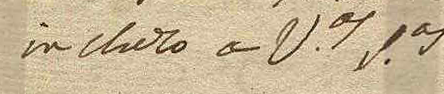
incluzo a V.as S.as
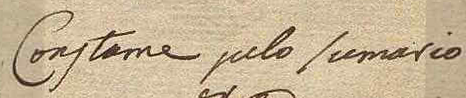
Constame pelo sumario
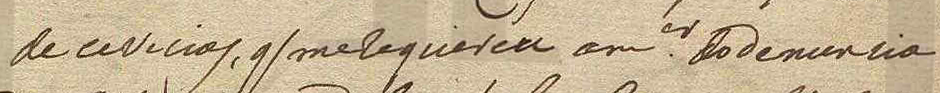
de cevicios, q̄ me Requereu a m.er do denuncia
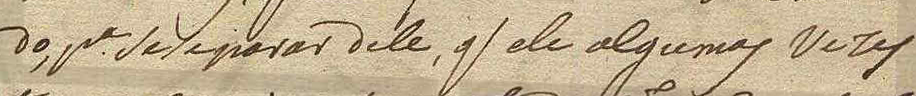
do, p.a se separar dele, q̄ ele algumas vezes
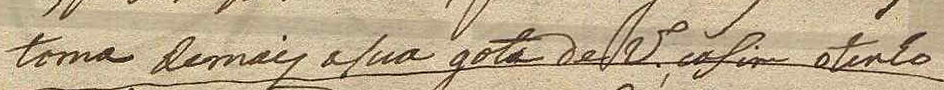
toma demais a sua gota de V.o, e asim o tenho
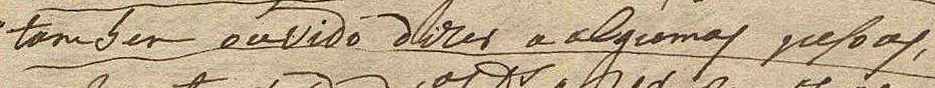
tambem ouvido dizer a algumas pesoas,
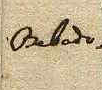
Bebado
